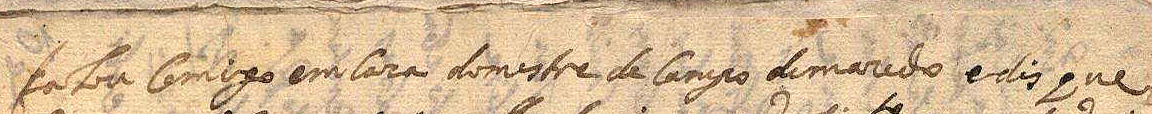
falou Comigo em caza do mestre de Campo de macedo e dis que
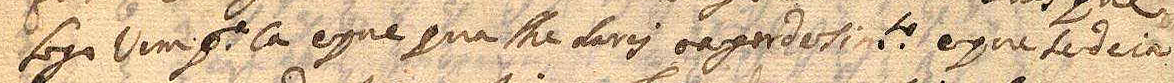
logo Vem p.a ca e que qua lhe darej o agardesim.to e que se deia
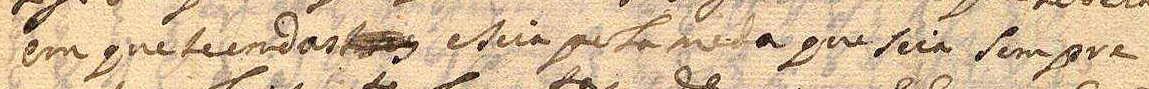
em que te endas_ e seia pela uida que seia sempre
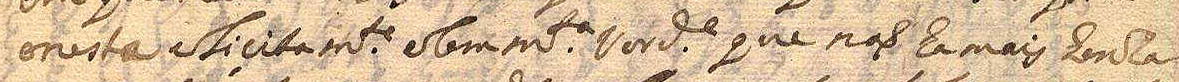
e nesta ilicitam.te e Com m.ta verd.e que naõ ha mais honRa
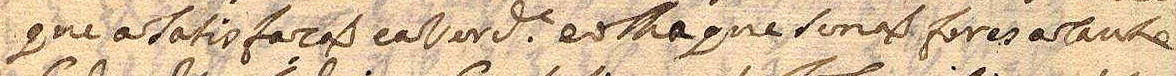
que a satisfaçaõ e a verd.e e olha que se naõ fores acaute
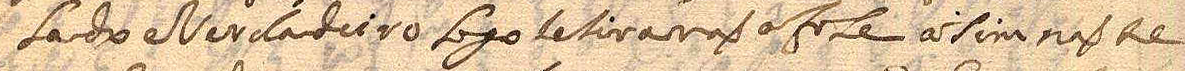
lado e Verdadeiro logo se tiraraõ a foLe asim naõ te
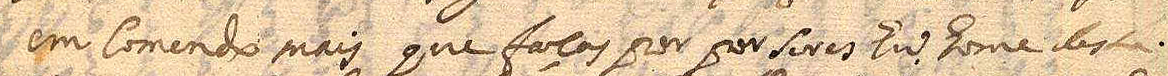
emComendo mais que faças por por seres hū home desta
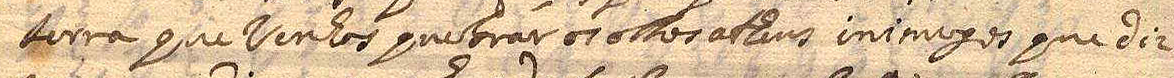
terra que Venhas quebrar os olhos a theus inimigos que diz
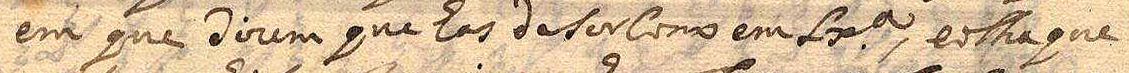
em que dizem que has de ser Como em Lx.a, e olha que
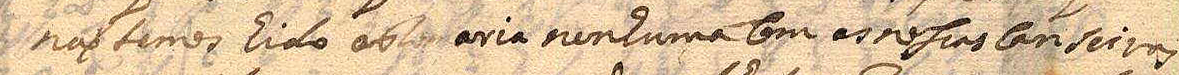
naõ temos hido a Romaria nenhuma com as nossas canseiras
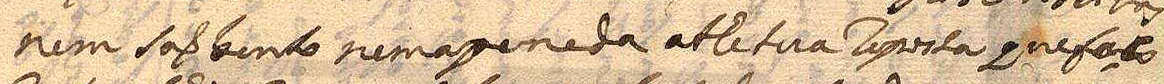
nem saõ bento nem a peneda athe ter a Reposta que faço
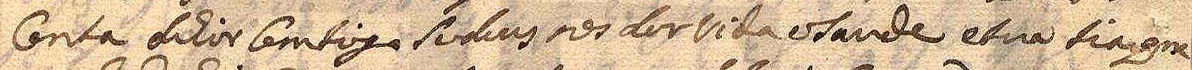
conta de hir Comtigo se deus nos der vida e saude e tua tia que
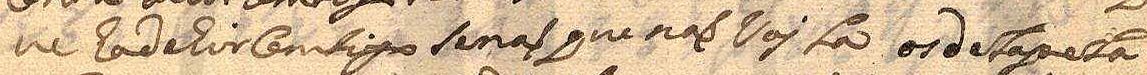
ue ha de hir Comtigo senaõ que naõ vaj La os de LapeLa
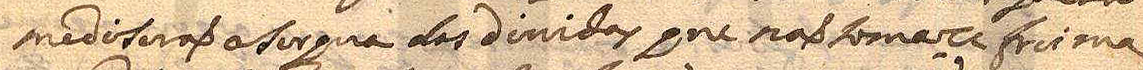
me diseraõ aserqua das diuidas que naõ tomace freima
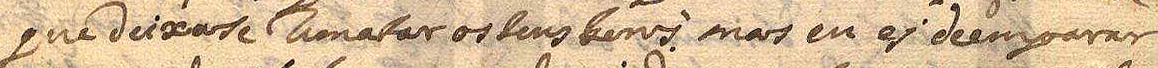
que deixase Rematar os teus bens̄ mas eu ej de emparar
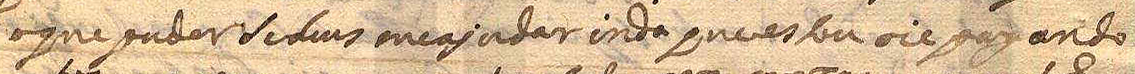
o que puder se deus me ajudar inda que estou oie pagando
